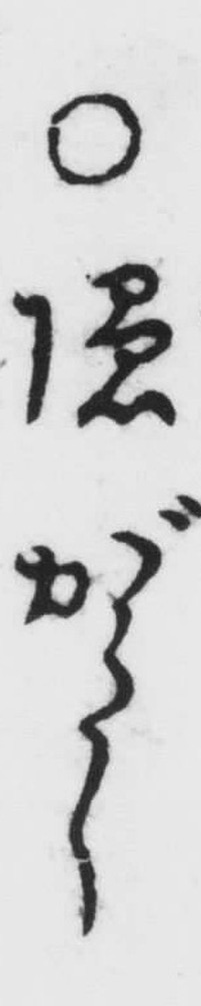○隠がらし
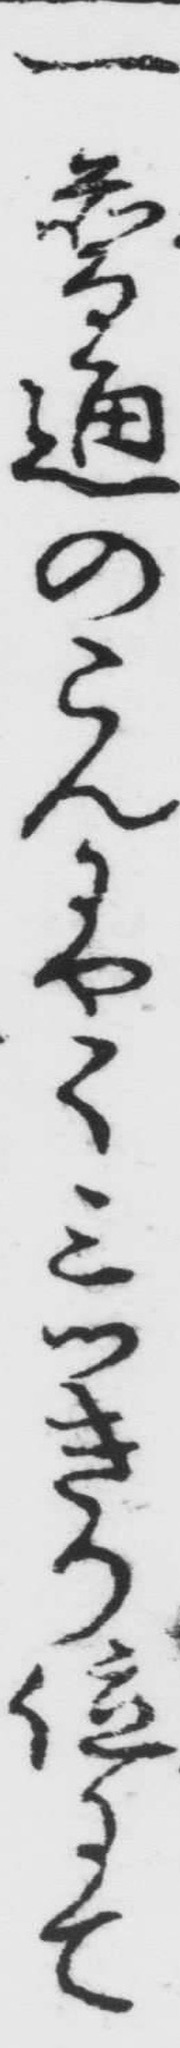一普通のこんにやく三つきり位にて
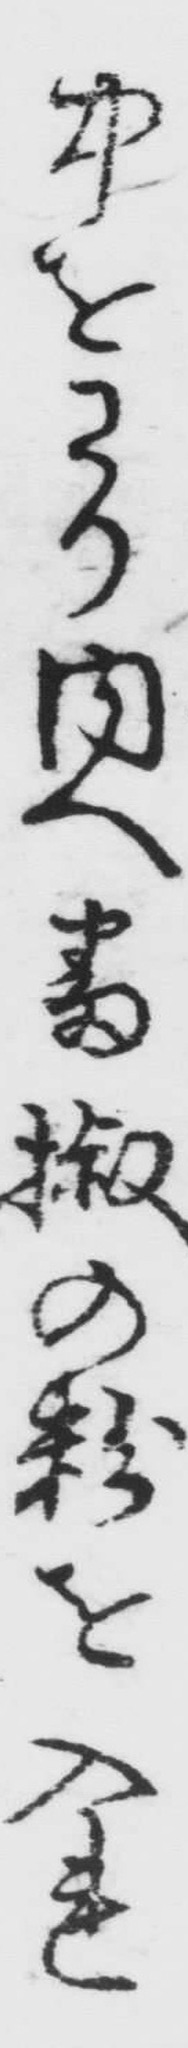中をわり内へ番椒の粉を入れ

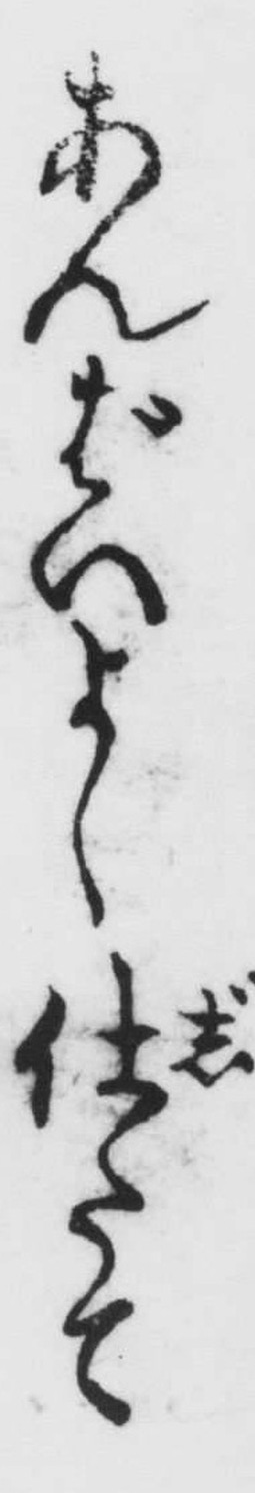あんばいよく仕たて
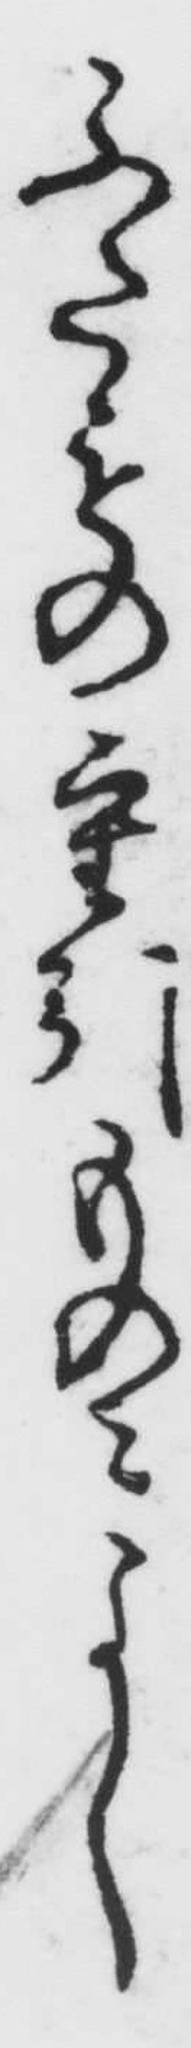ふたもの重引ものによし
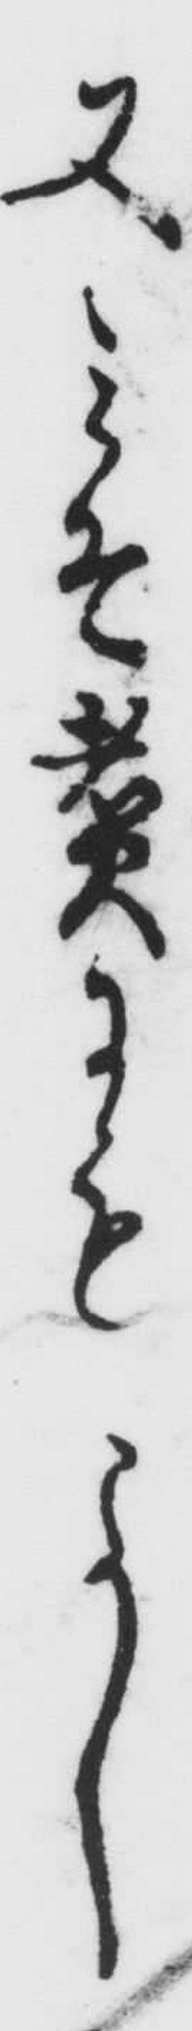又みそ煮にもよし
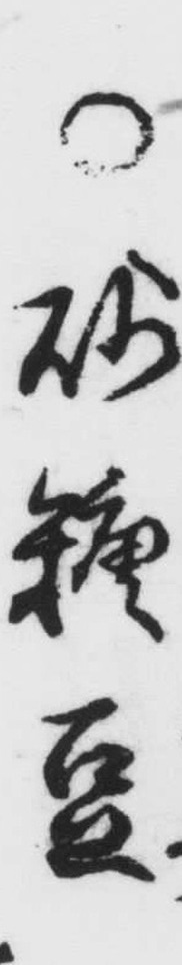○砂糖豆
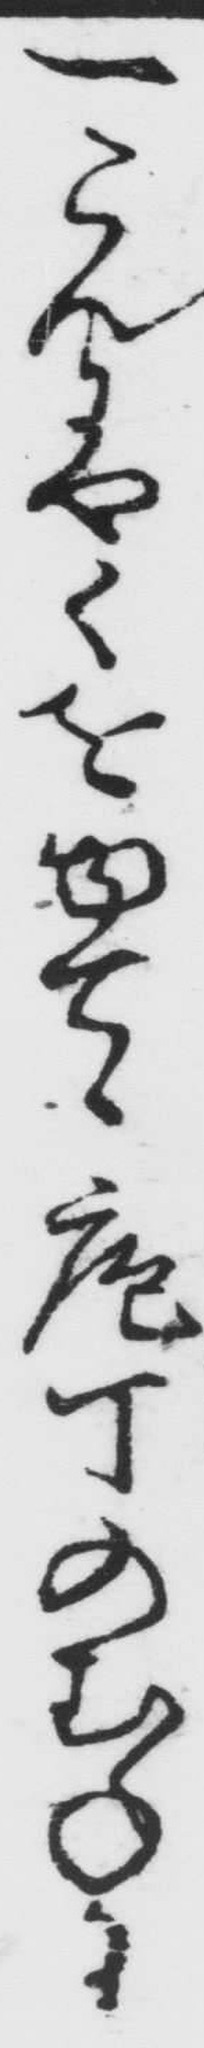一こんにやくをゆてゝ庖丁のむねに
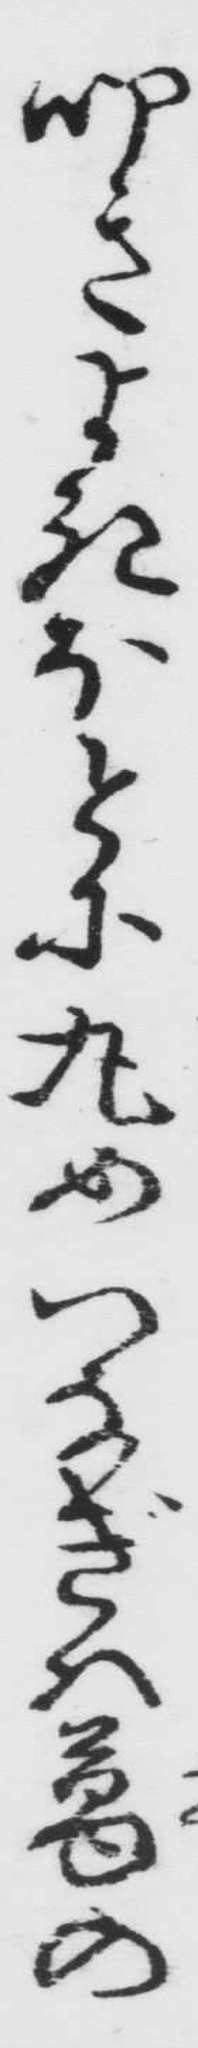叩きよきほとに丸めつなぎは葛の
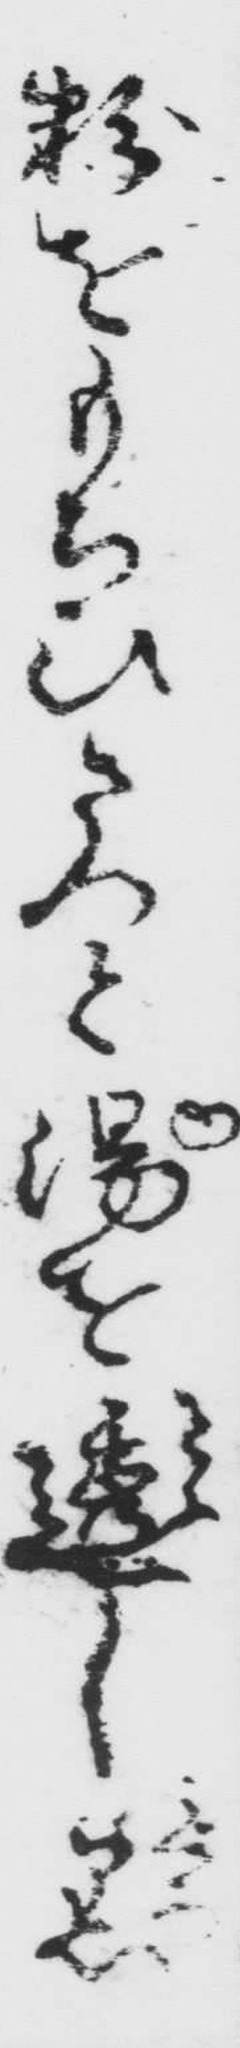粉をもちひさつと湯を透し黒
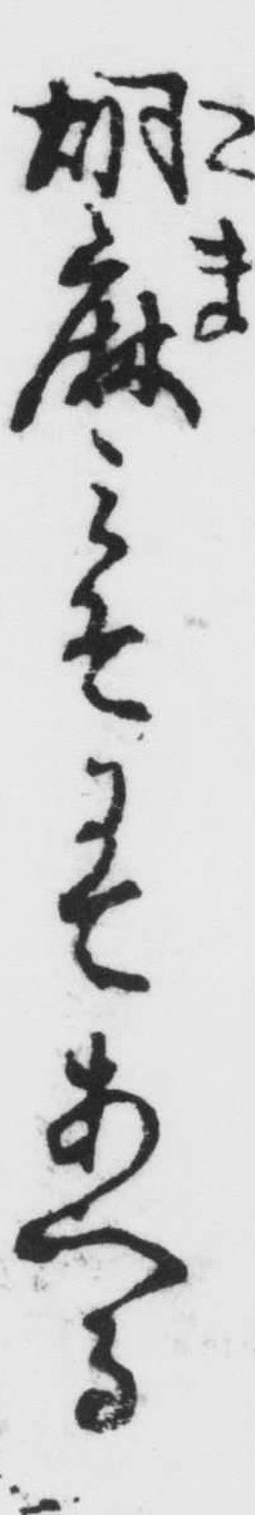胡麻みそにてあへる
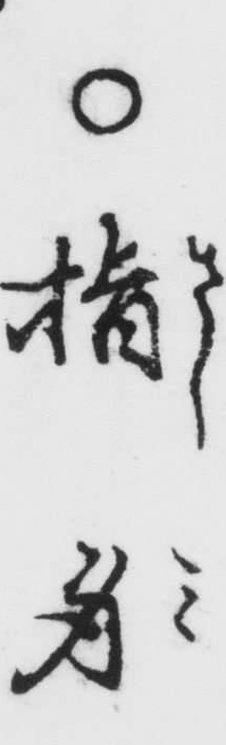○指身
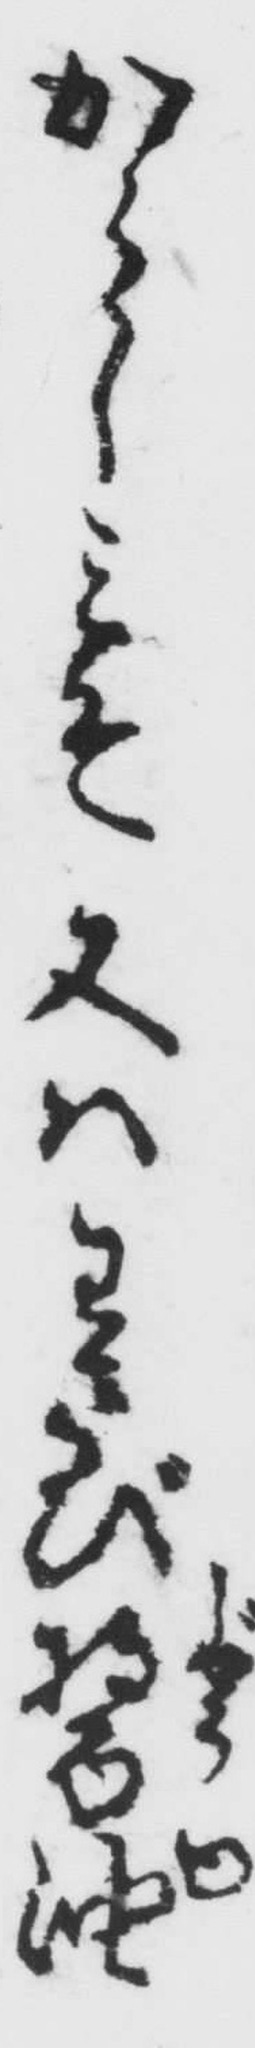からしみそ又はわさび醤油
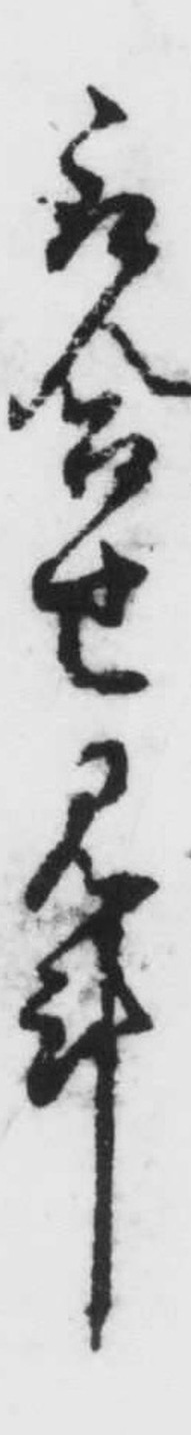取合せ見斗

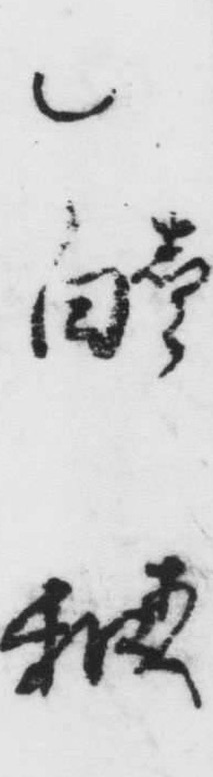○白和
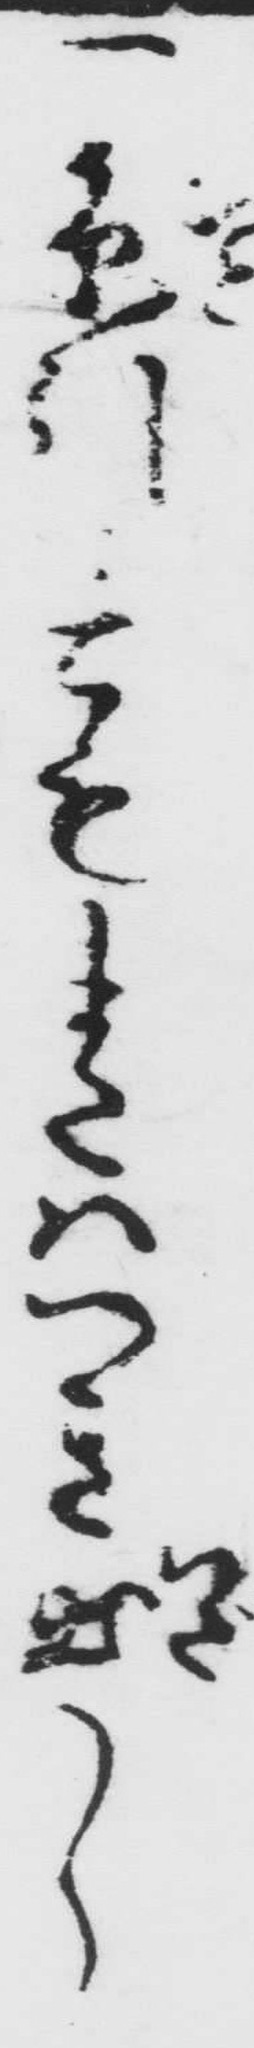一糸引にてもまたはつき出し
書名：蒟蒻百珍
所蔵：大阪府立大学学術情報センター 国文学研究資料館
